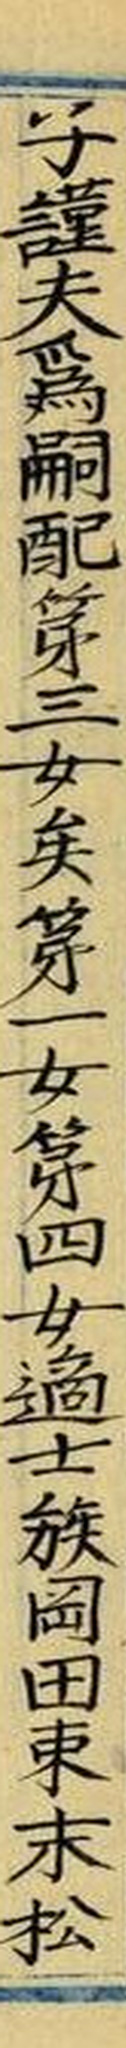子謹夫爲嗣配第三女矣第一女第四女適士族岡田束末松
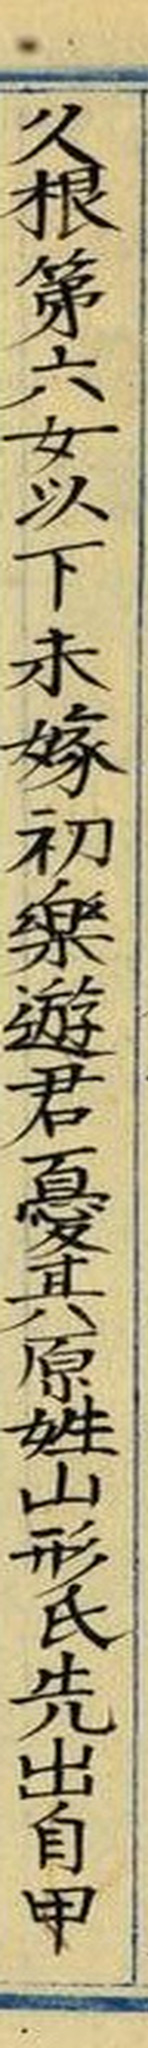久根第六女以下未嫁初樂遊君憂其原姓山形氏先出自甲
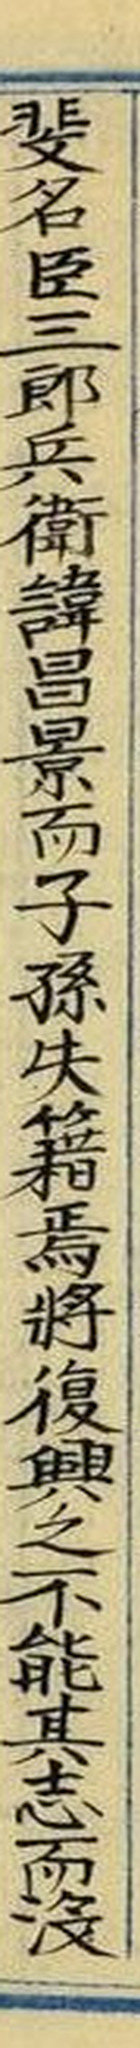斐名臣三郎兵衛諱昌景而子孫失籍焉將復興之不能其志而沒
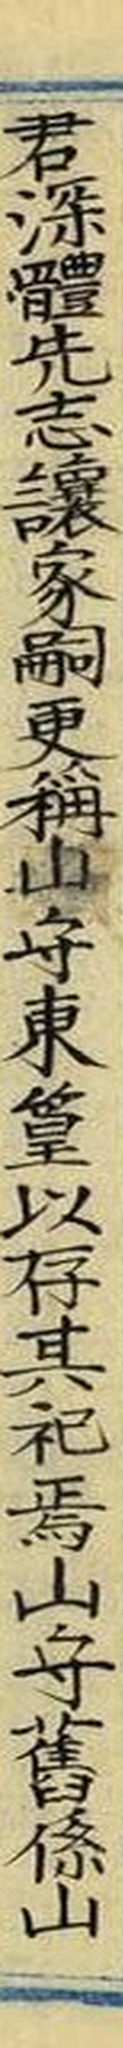君深體先志讓家嗣更稱山守東篁以存其祀焉山守舊係山
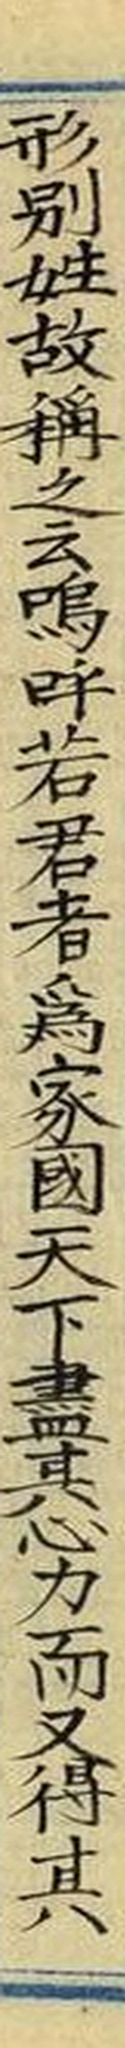形別姓故稱之云嗚呼若君者爲家國天下盡其心力而又得其
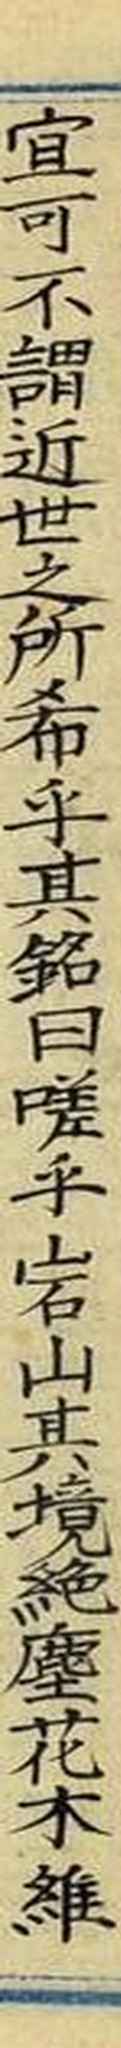宜可不謂近世之所希乎其銘曰嗟乎宕山其境絶塵花木維
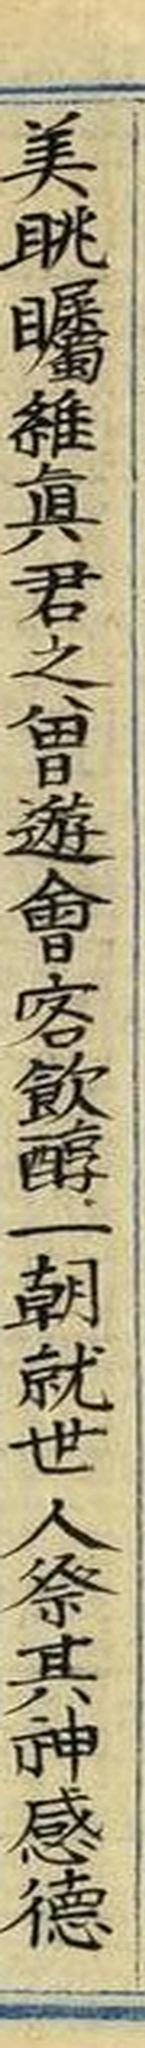美眺矚維眞君之曽遊會客飲醇一朝就世人祭其神感德
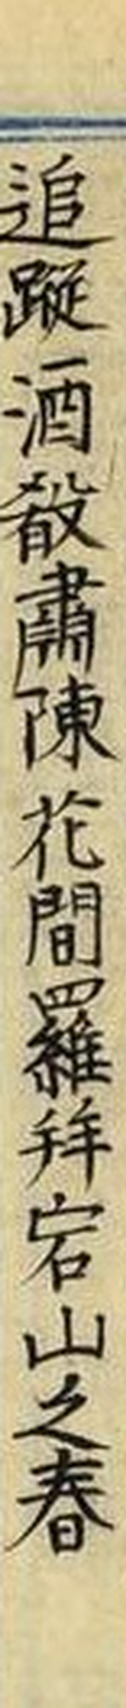追蹤酒殽肅陳花間羅拜宕山之春

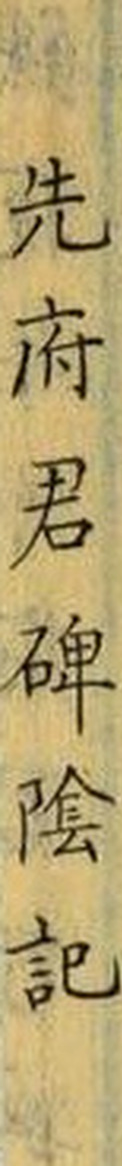先府君碑隂記
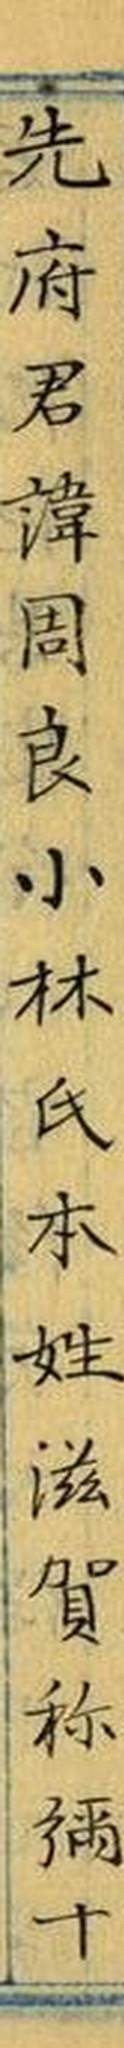先府君諱周良小林氏本姓滋賀称彌十
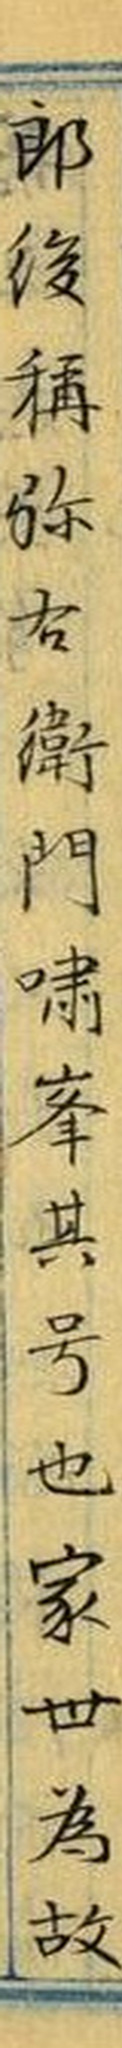郎後稱弥右衛門嘯峯其号也家世為故
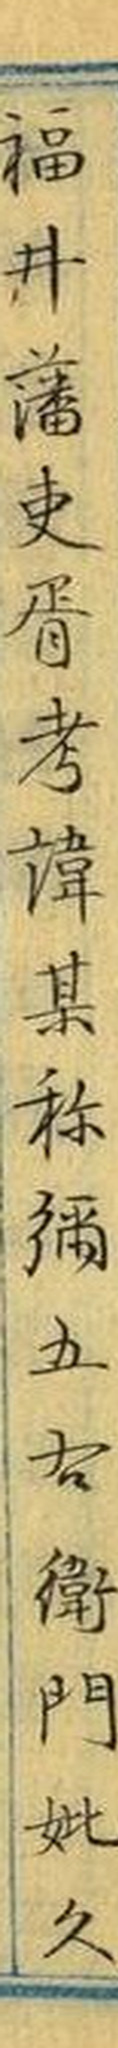福井藩吏胥考諱某称彌五右衛門妣久
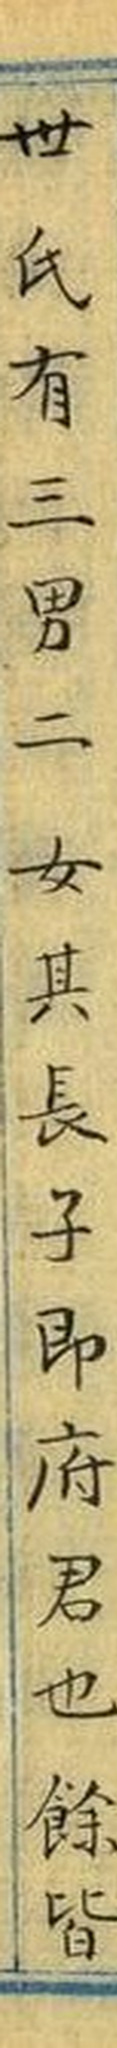世氏有三男二女其長子即府君也餘皆
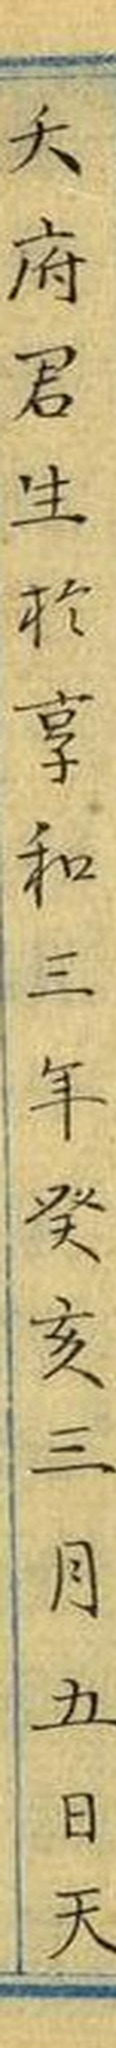夭府君生於享和三年癸亥三月五日天
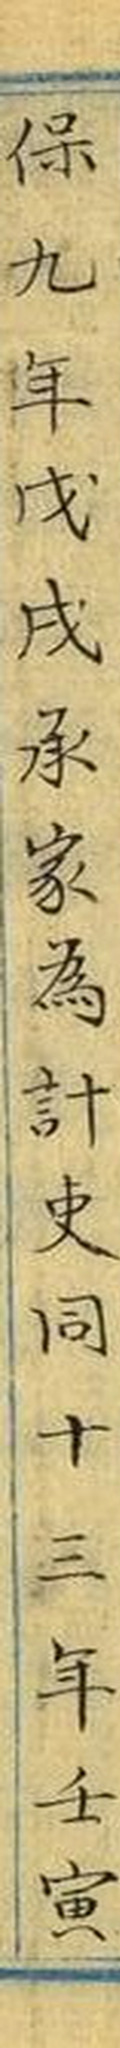保九年戊戌承家為計吏同十三年壬寅
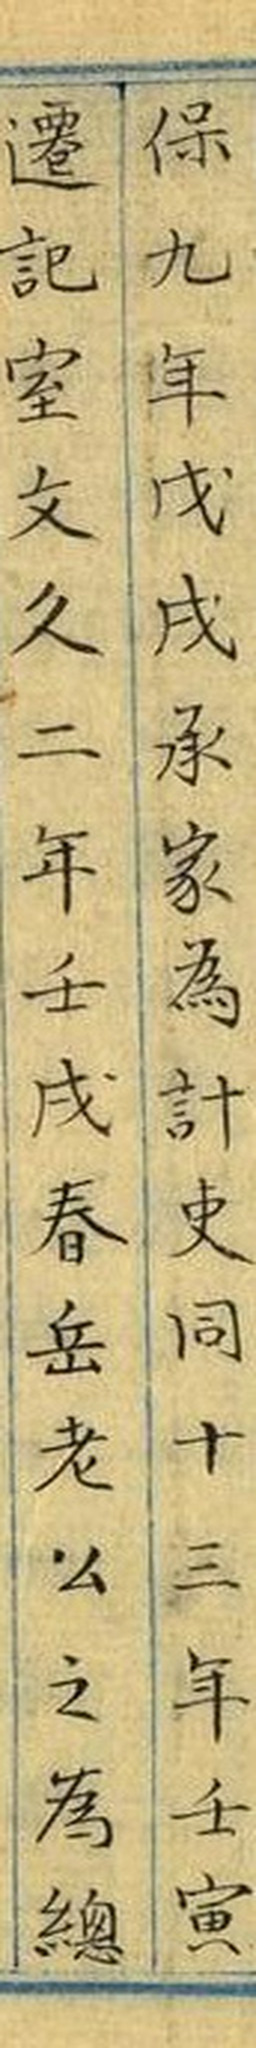遷記室文久二年壬戌春岳老公之為總
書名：温古集 四巻
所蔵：福井県文書館 Fukui Prefectural Archives
